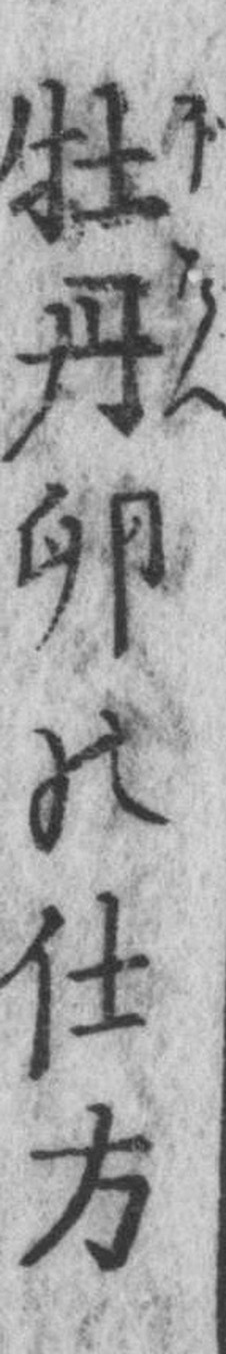牡丹卵の仕方
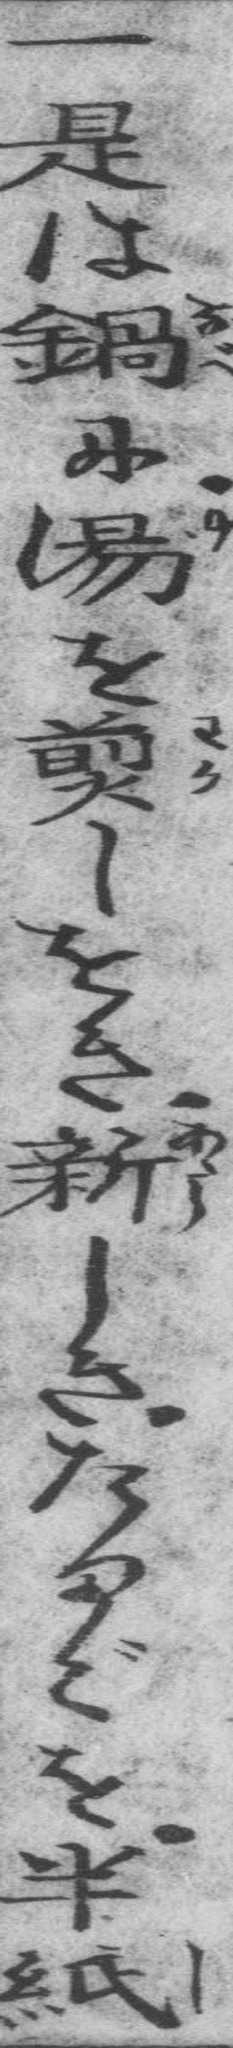一是は鍋に。湯を煎しをき。新しき。たまごを。半紙
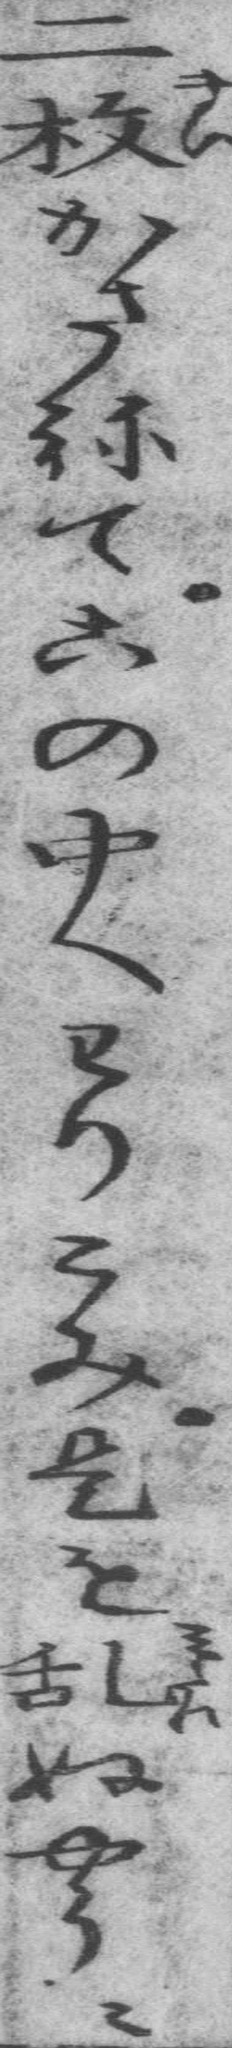二枚かさねて。この中へわりこみ。是を乱ぬやうに

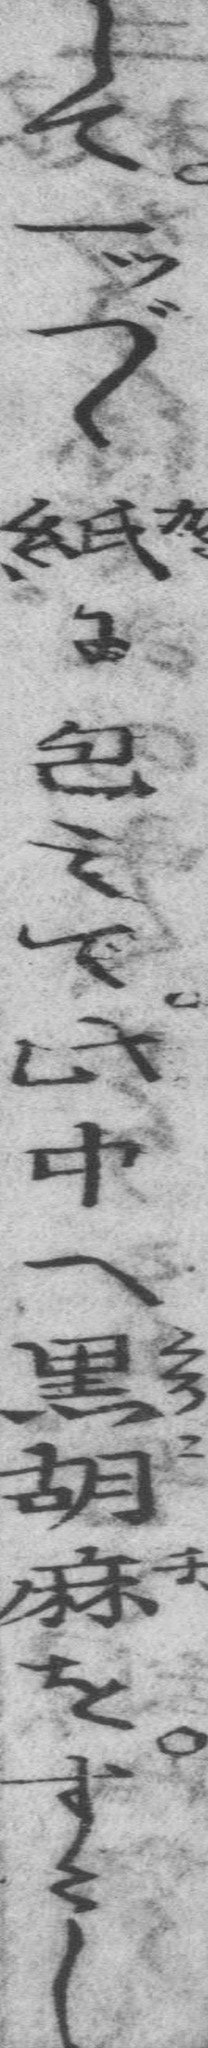して。一ツづゝ紙に包みて。此中へ黒胡麻を。すこし
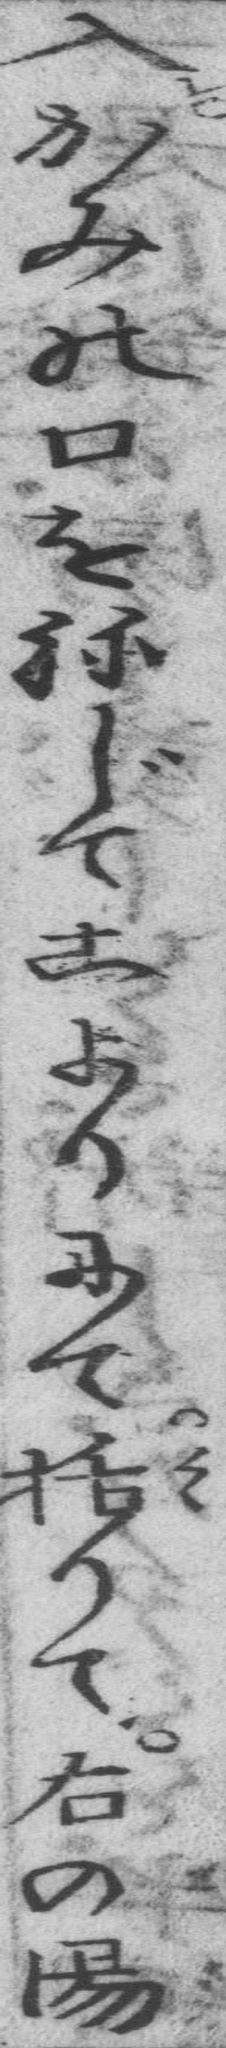入れ。かみの口をねじてこよりにて。括りて。右の湯
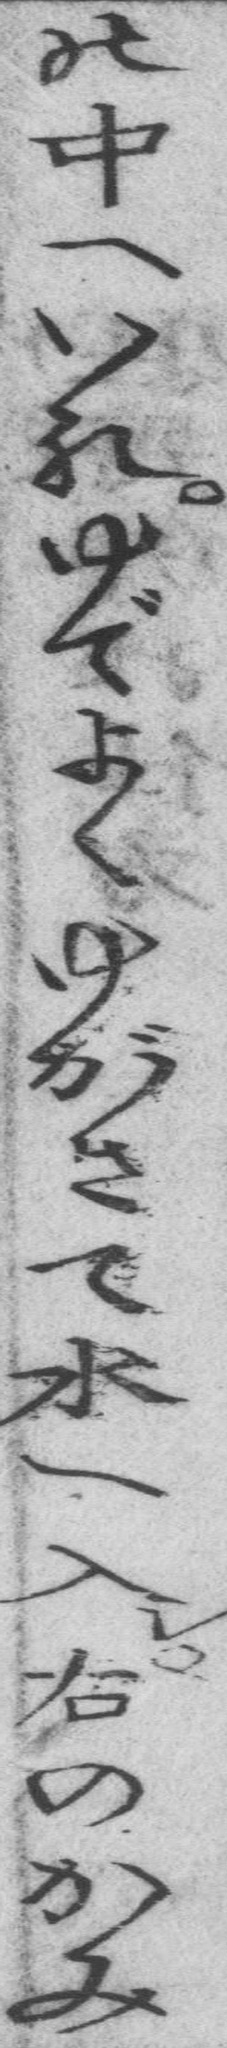の中へいれ。ゆでよくゆがきて水へ入れ。右のかみ
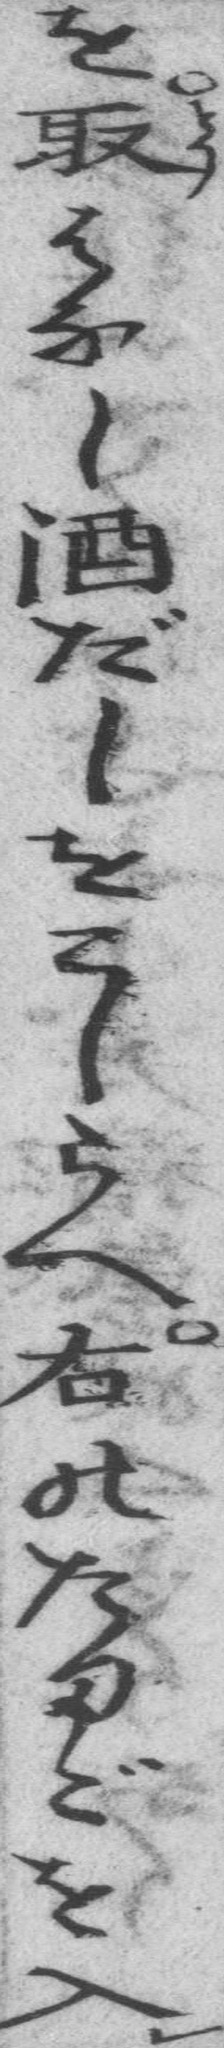を。取はなし酒だしをこしらへ。右のたまごを入れ
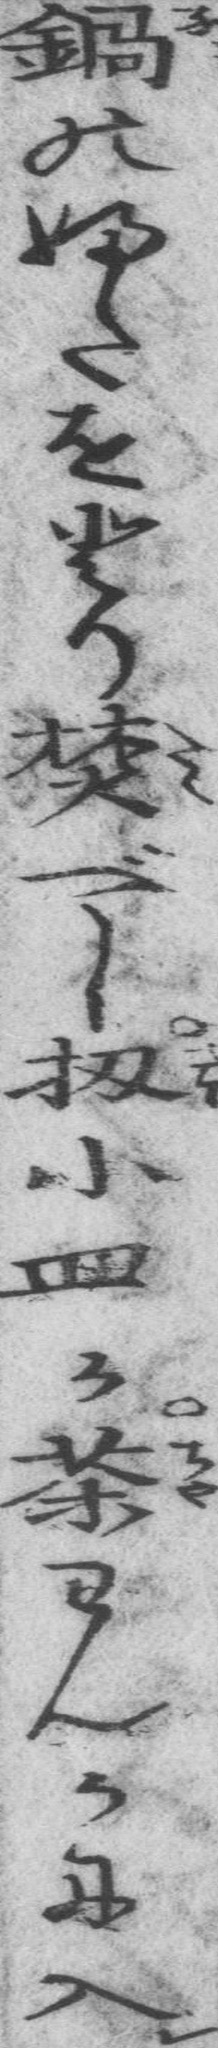鍋のふたをとり焚べし。扨小皿か。茶わんかに入れ
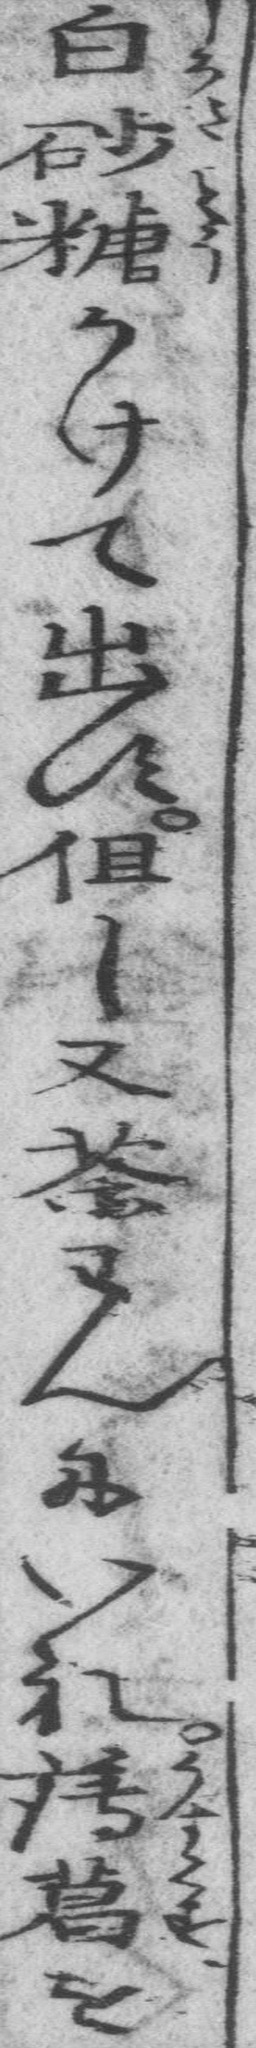白砂糖かけて出す。但し又茶わんにいれ。薄葛を
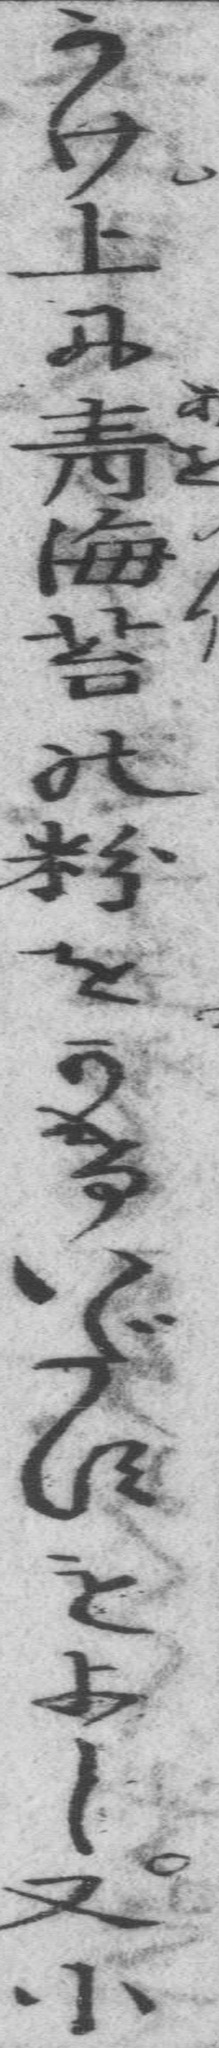かけ。上に青海苔の粉を。かけいだすもよし。又小
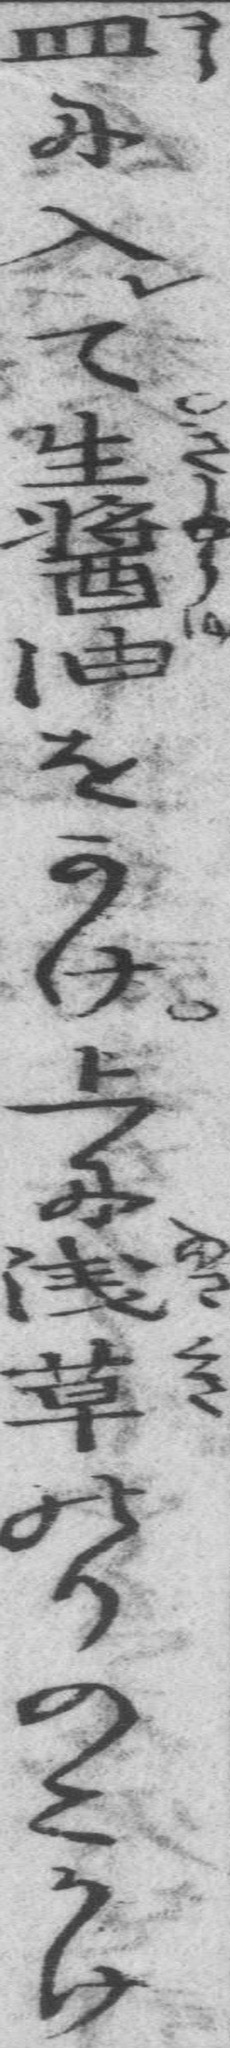皿に入れて。生醤油をかけ。上に浅草のりのこかけ
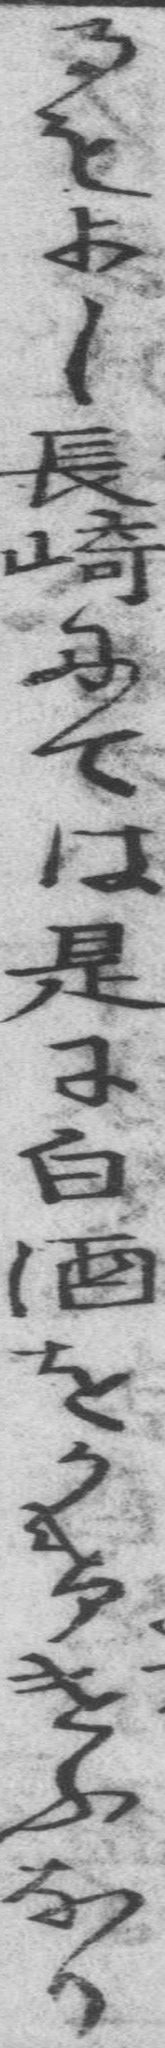るもよし。長崎にては。是に白酒をかけ。遣ふなり
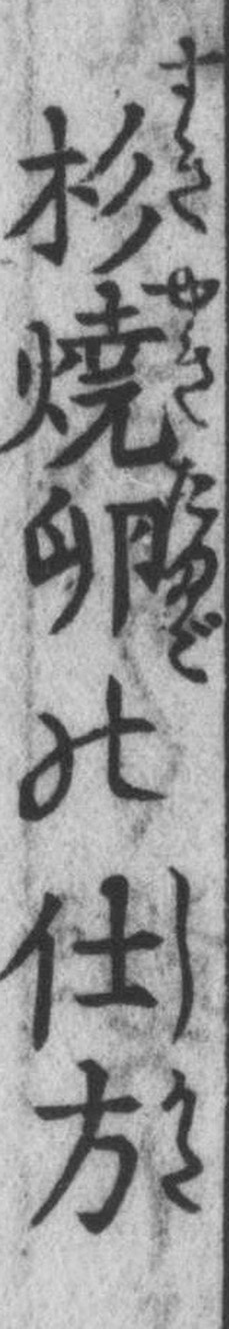杉焼卵の仕方
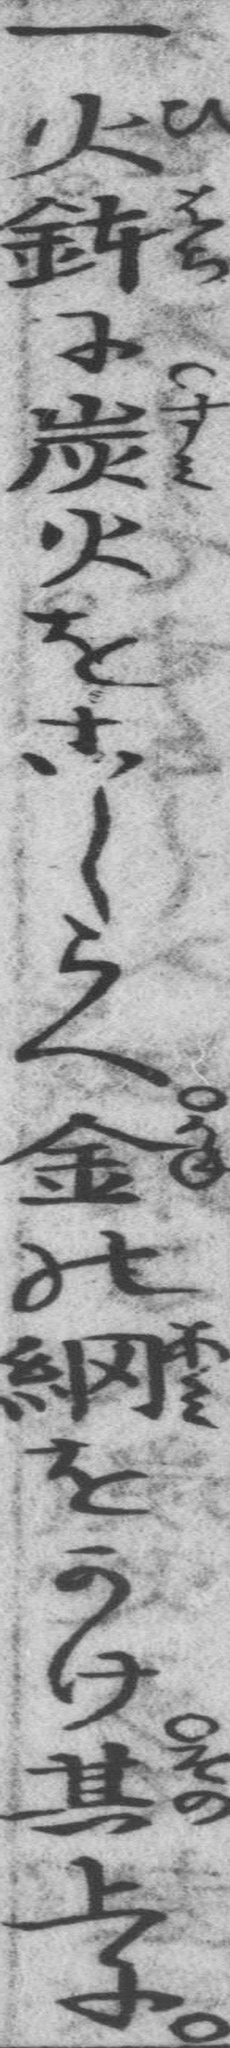一火鉢に。炭火をこしらへ。金の網をかけ。其上に。
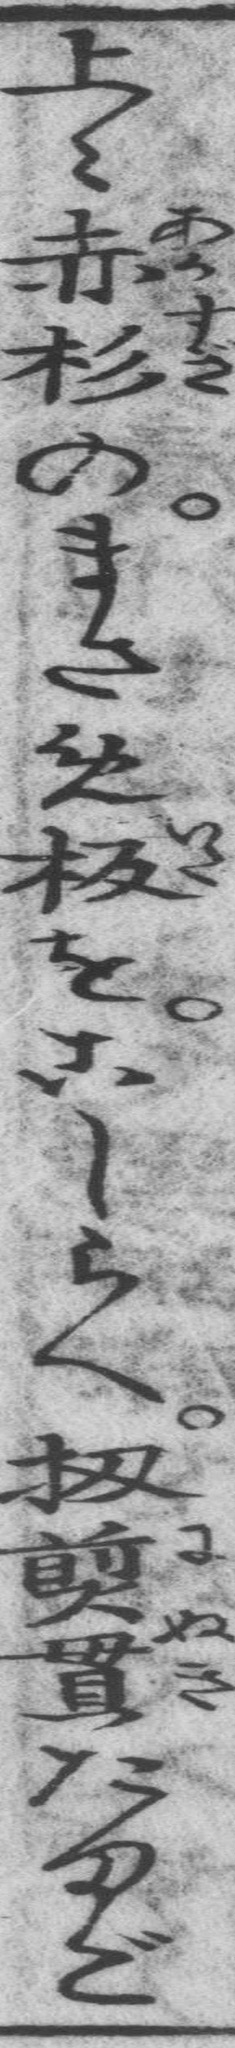上々赤杉の。まさめ板を。こしらへ。扨煎貫たまご
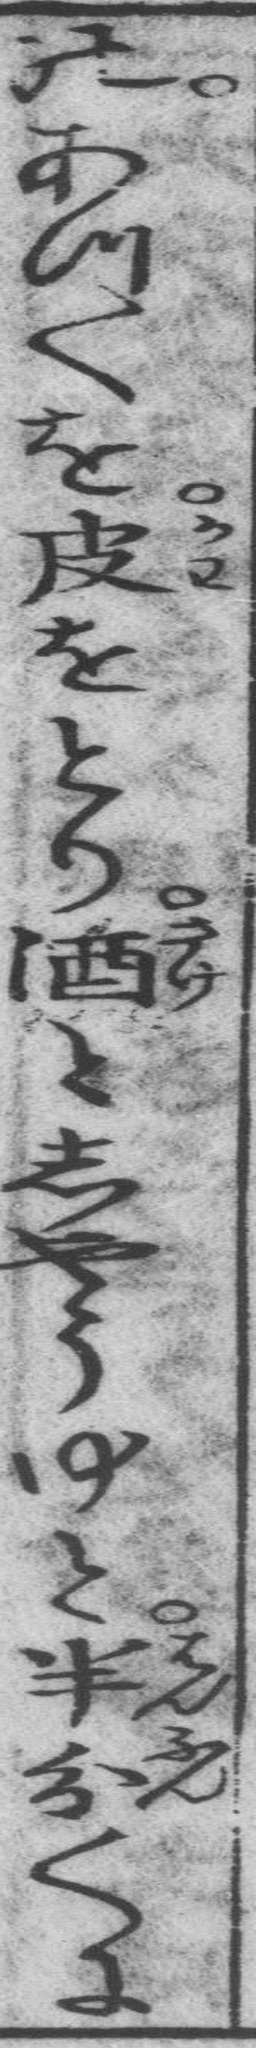の。あつ〳〵を。皮をとり。酒としやうゆと。半分〳〵に
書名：萬寳料理秘密箱
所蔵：大阪府立大学学術情報センター 国文学研究資料館
